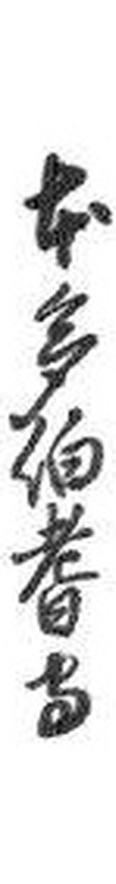本多伯耆守
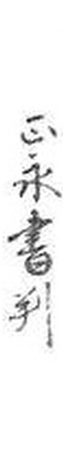正永書判
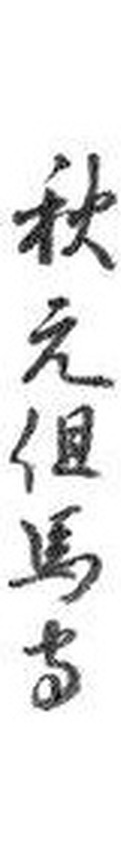秋元但馬守
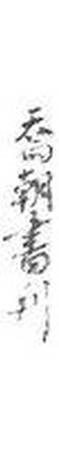喬朝書判
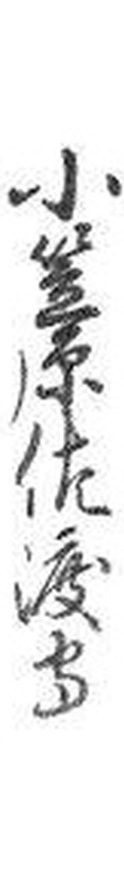小笠原佐渡守
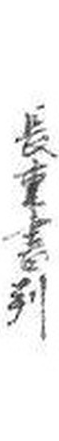永重書判
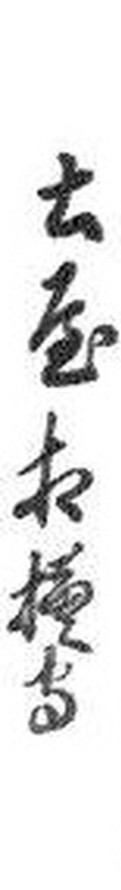土屋相模守
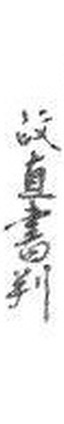政直書判
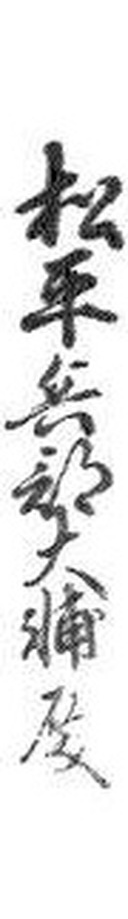松平兵部大輔殿
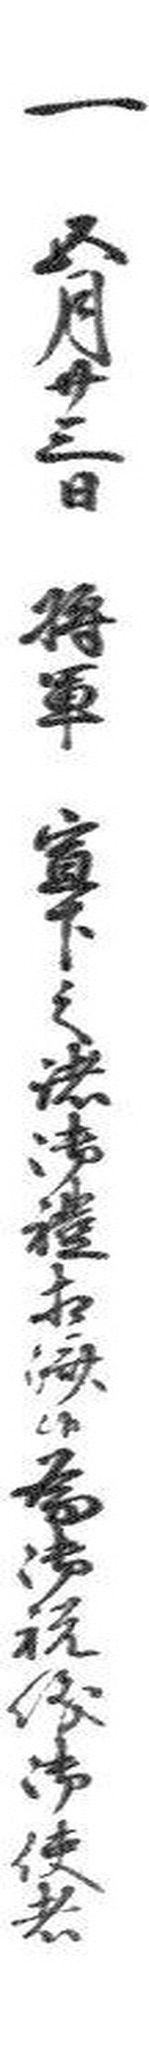一五月廿三日将軍宣下之諸御礼相済候為御祝儀御使者
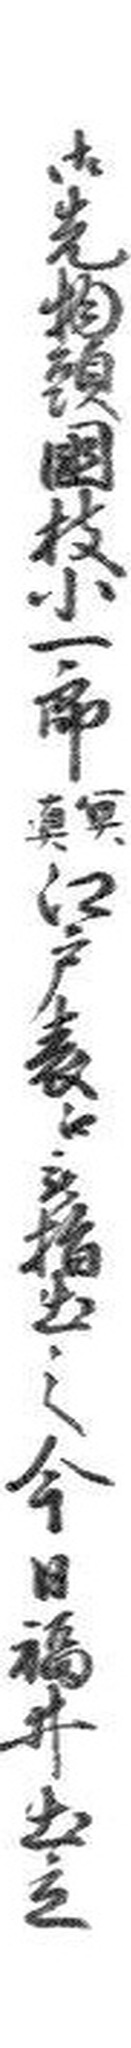御先物頭国枝小一郎冥真江戸表江被指出之今日福井出立
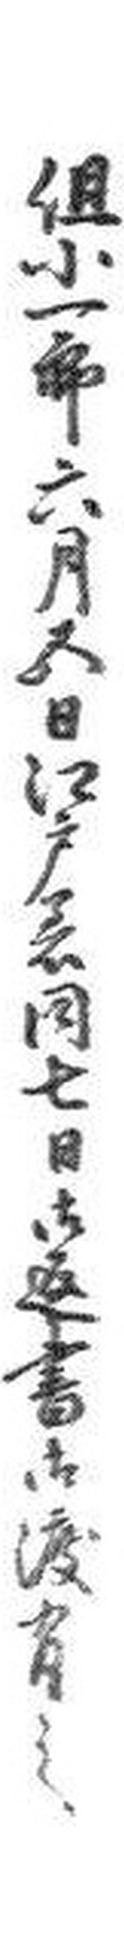但小一郎六月五日江戸着同七日御返書御渡有之
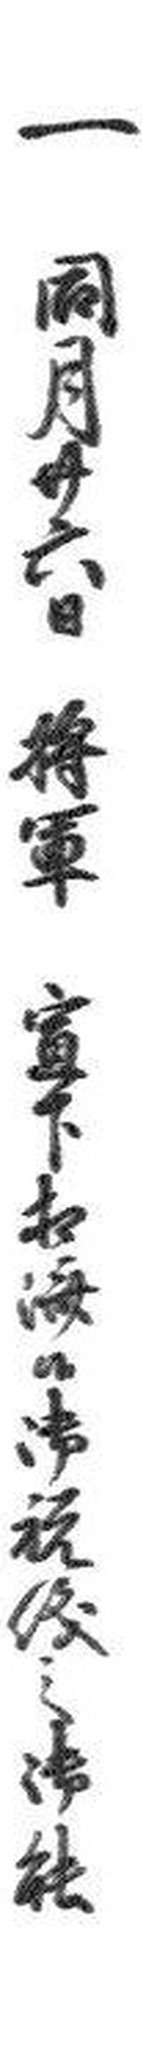一同月廿六日将軍宣下相済候御祝儀之御能
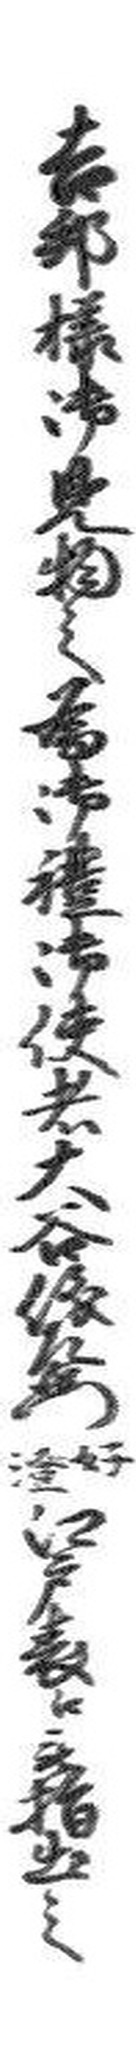吉邦様御見物之為御礼御使者大谷儀左衛門好澄江戸表江被指出之
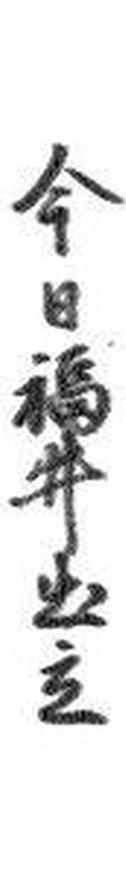今日福井出立
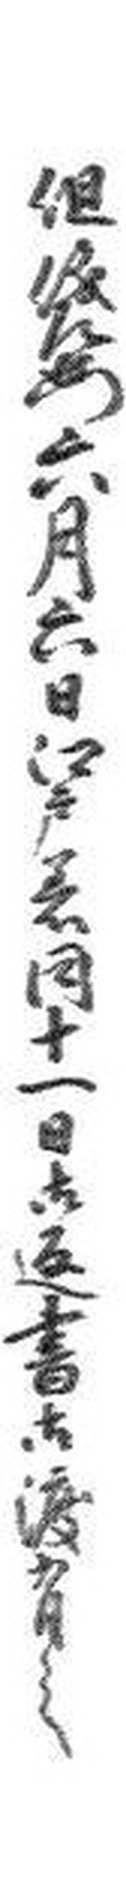但儀左衛門六月六日江戸着同十一日御返書御渡有之
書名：家譜 二十五 吉品公 従宝永六年到同七年
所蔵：福井県文書館 Fukui Prefectural Archives
